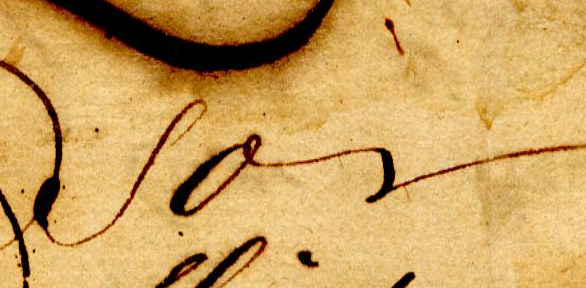For
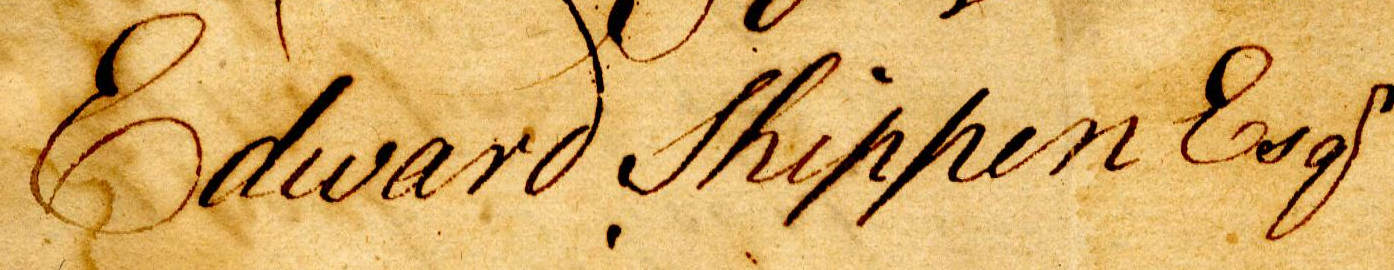Edward Shippen Esq^r
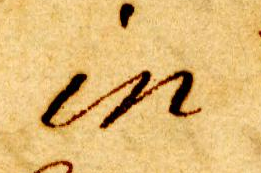in
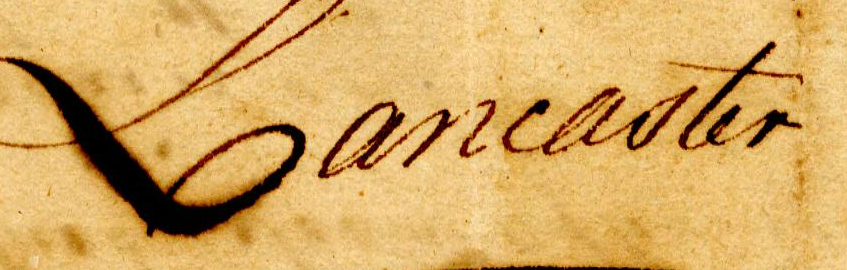Lancaster
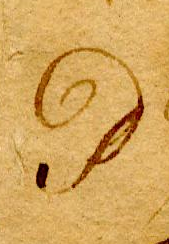P
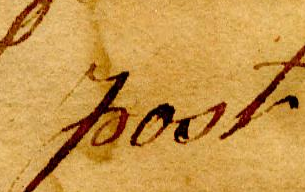post
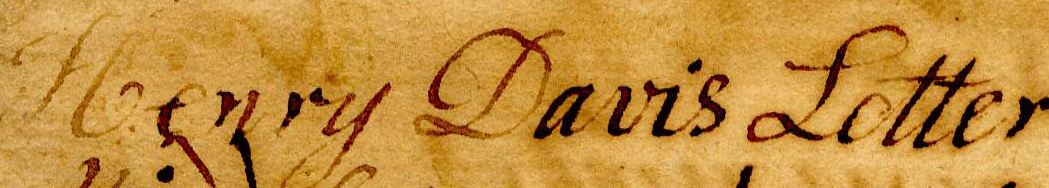Henry Davis Letter
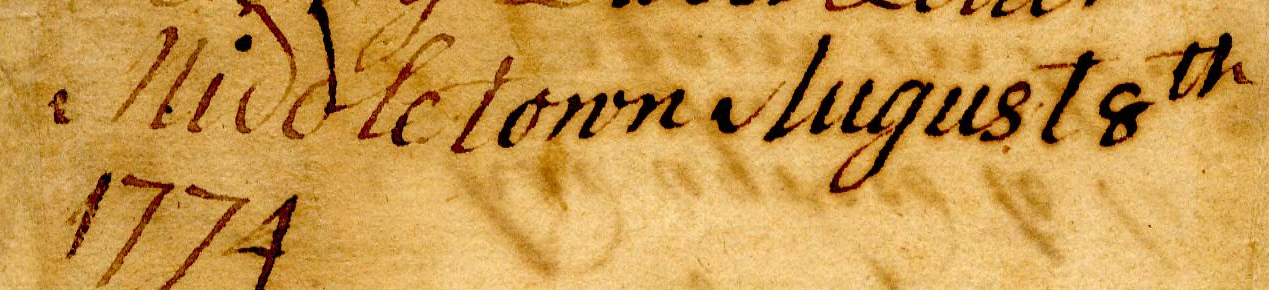Middletown August 8^th
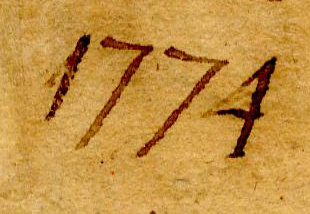1774
